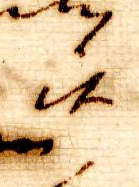it
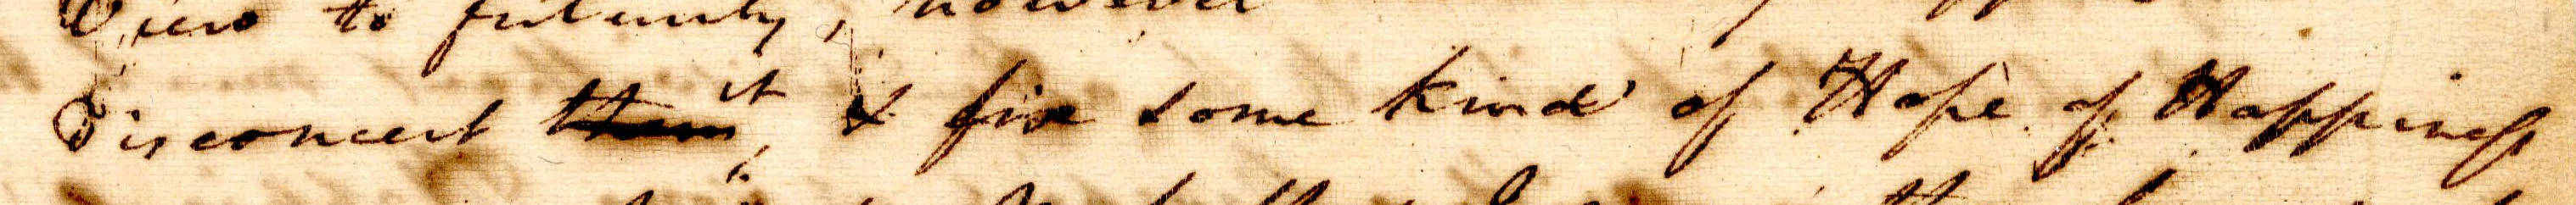disconcert them ^ & fixe some kind of Hope of Happiness
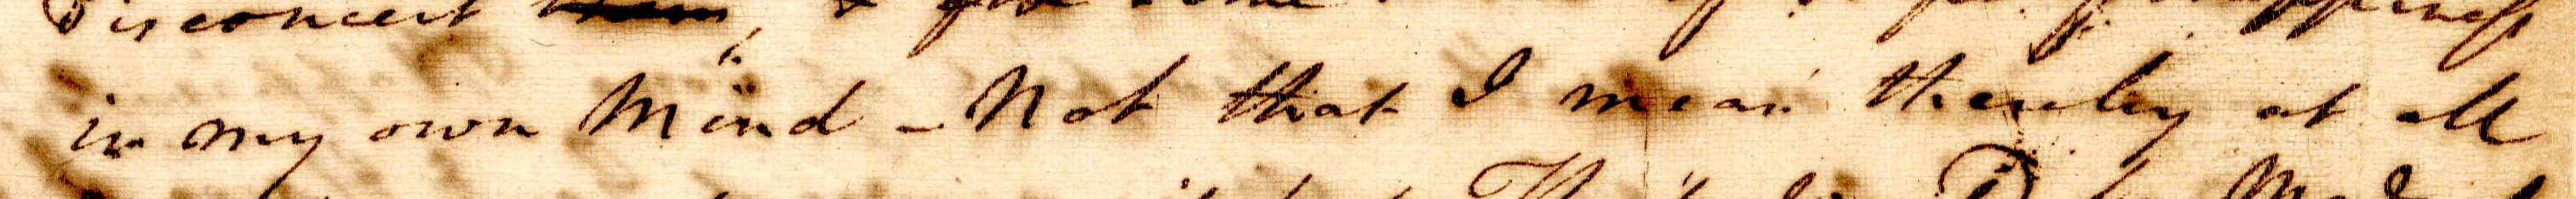in my own Mind- Not that I mean thereby at all
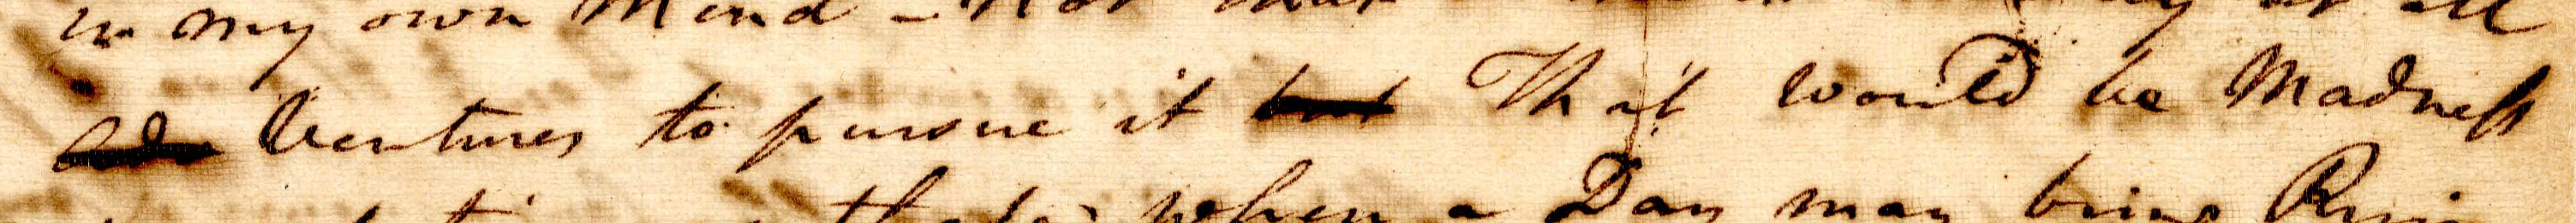also Ventures to pursue it but That would be Madness
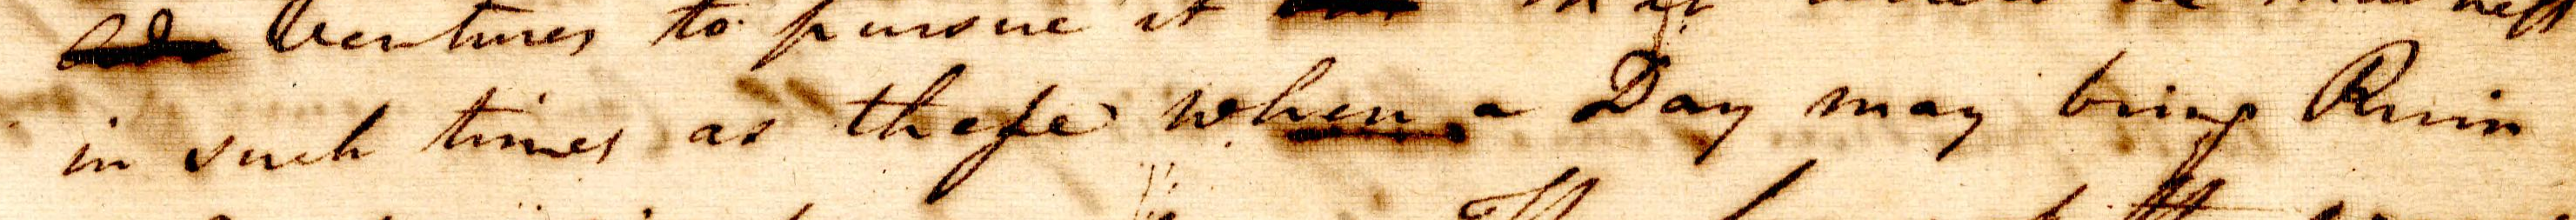in such times as those when a Day may bring Ruin
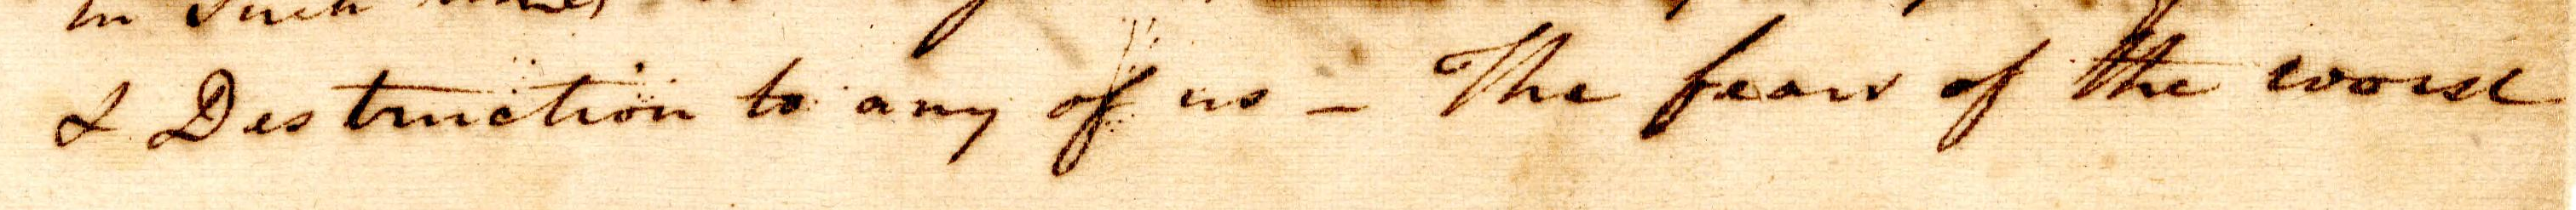& Distraction to any of us- The fear of the worse
